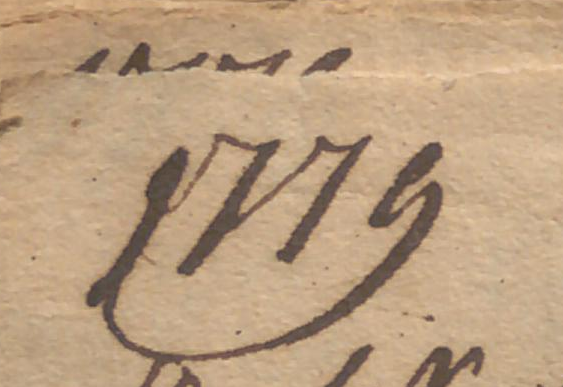1779
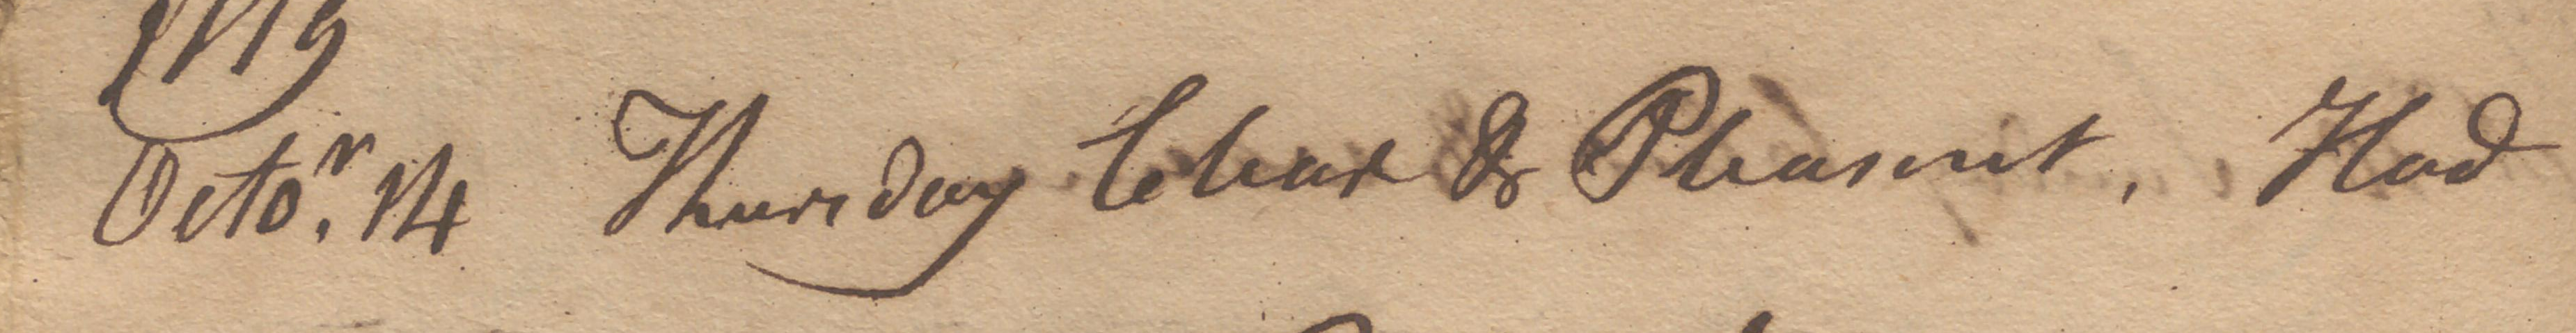Octo^r. 14 Thursday Clear & Pleasent. Had
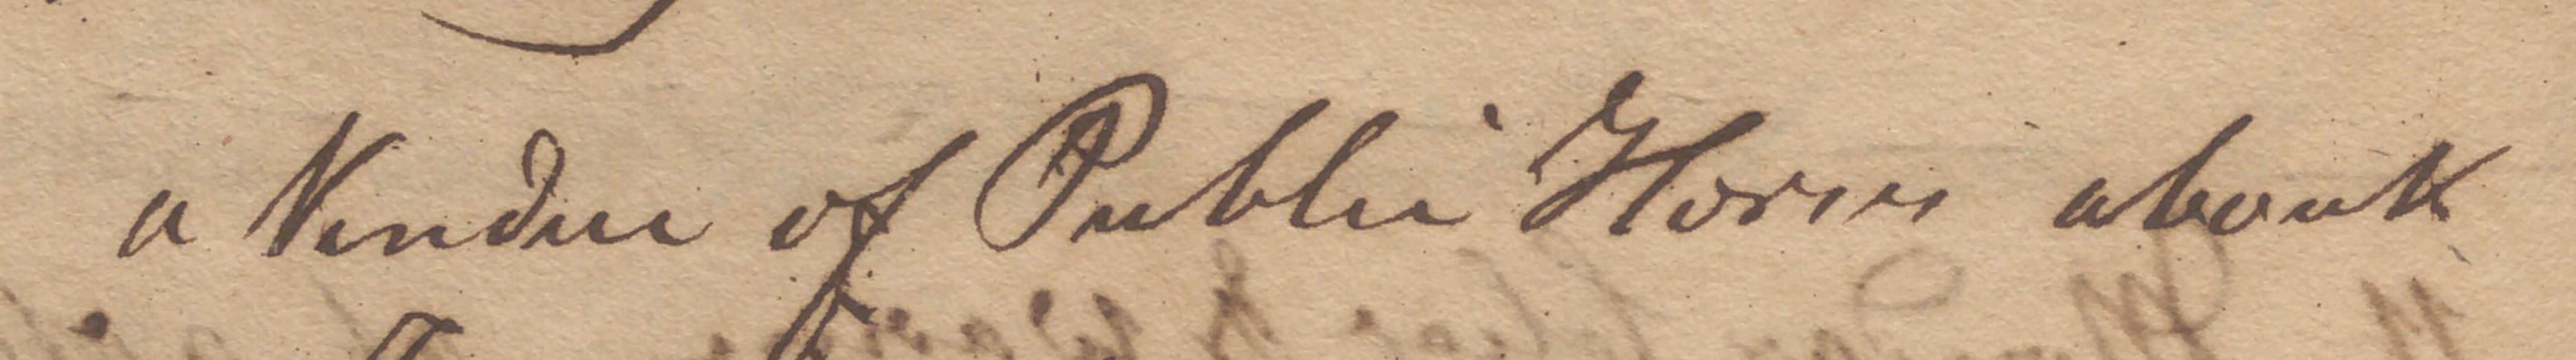a Vendue of Public Horses about
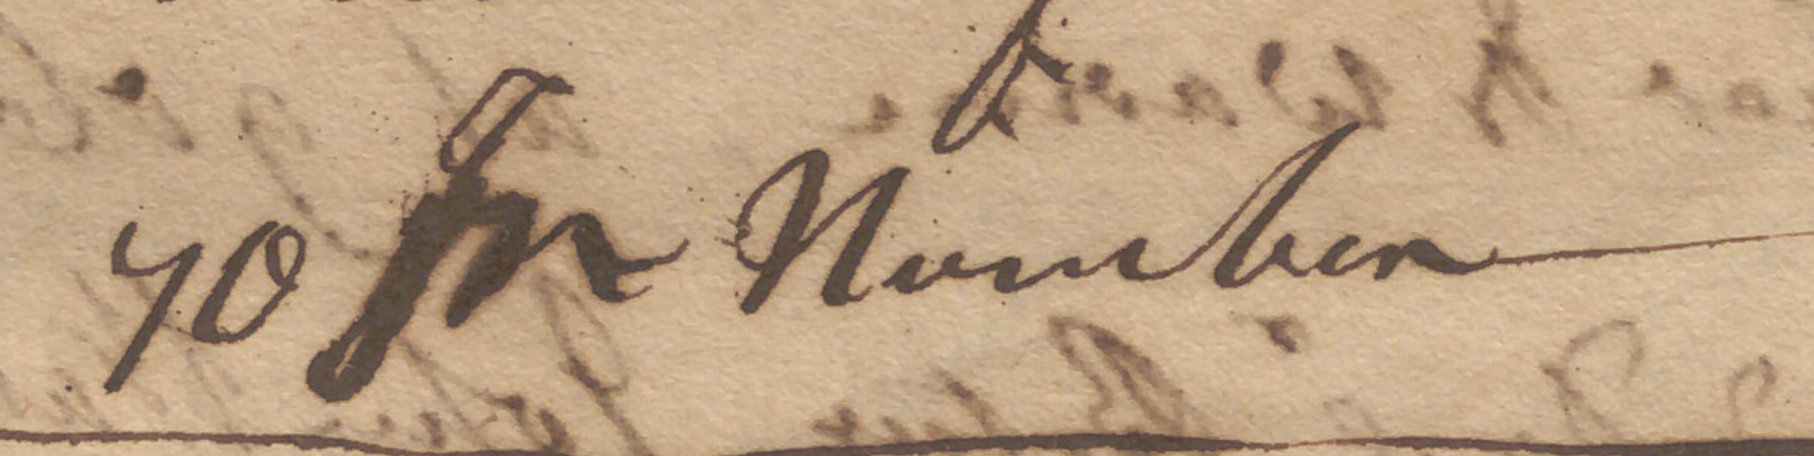70 In Number
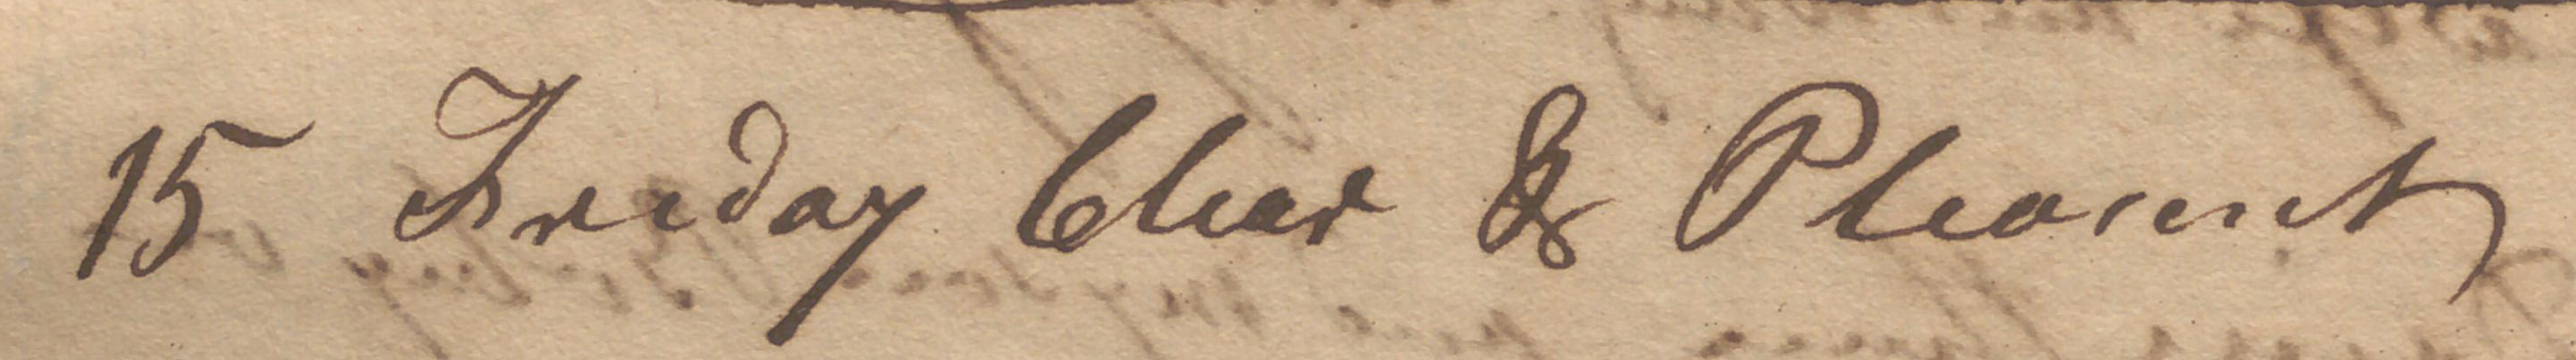15 Friday Clear & Pleasent
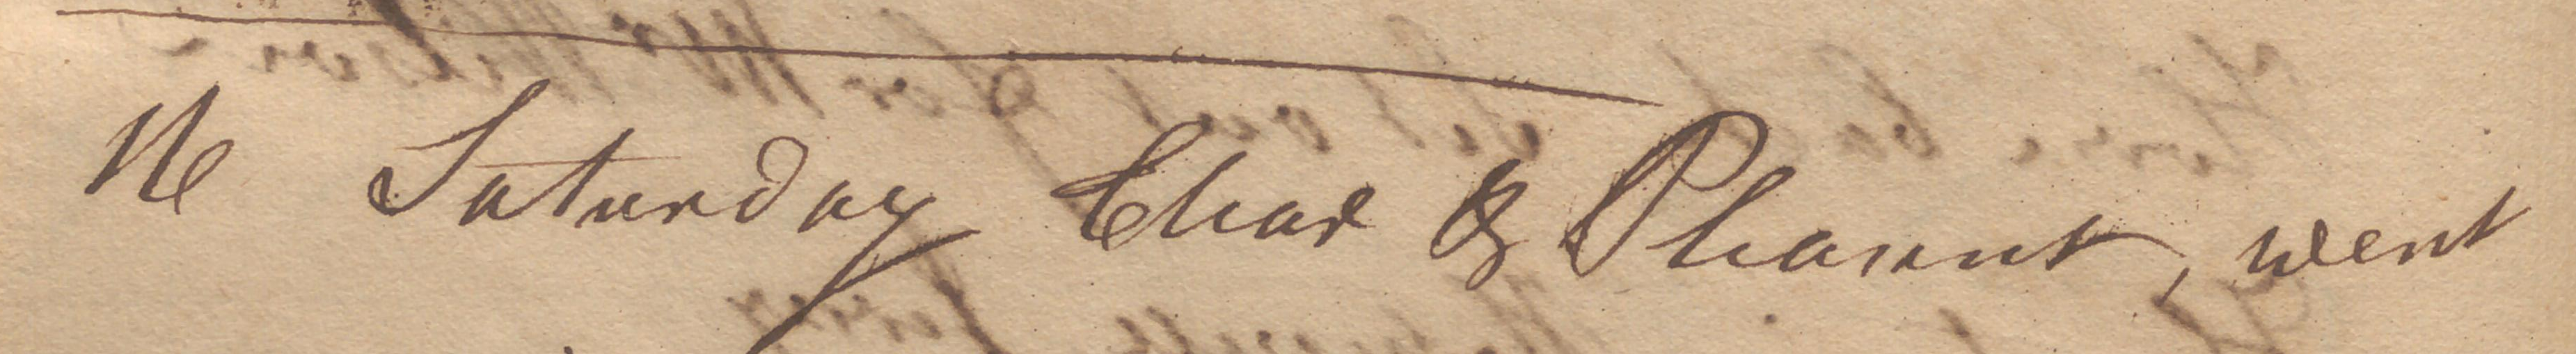16 Saturday Clear & Pleasent, went
